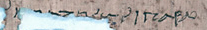νημαζηνωνιπαρα
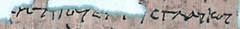μητριουεντιϲγλαυκου
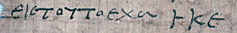ειϲτουτοεχω Ͱκε
